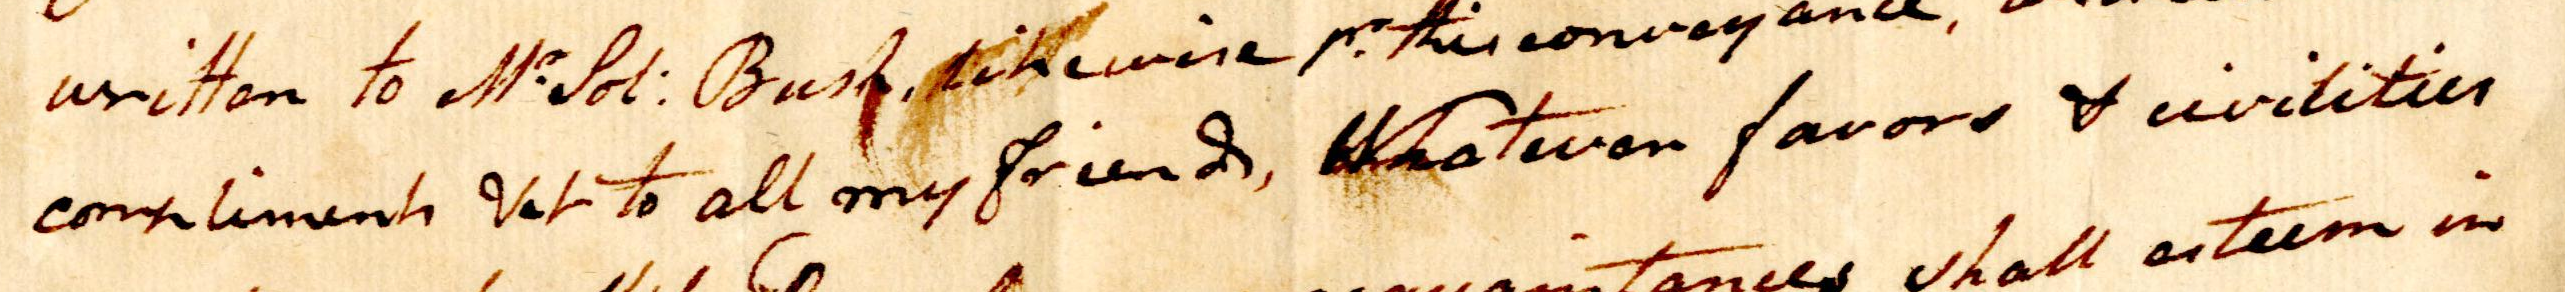compliments var to all my friends, Whatever favors & civilities
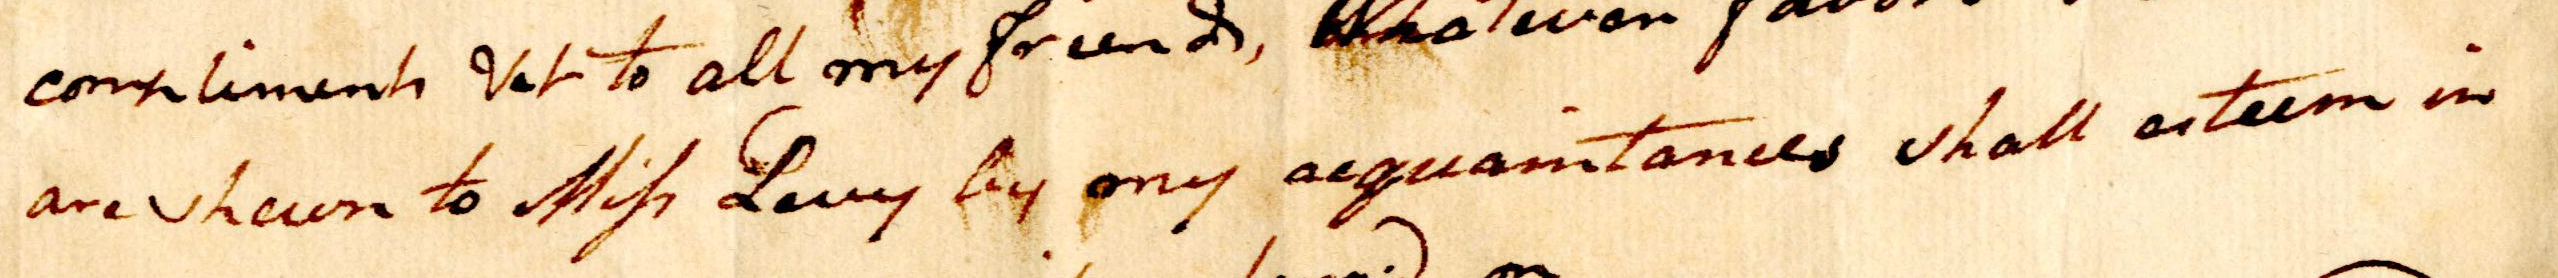are shewn to Miss Levy by any acquaintances shall asteem in
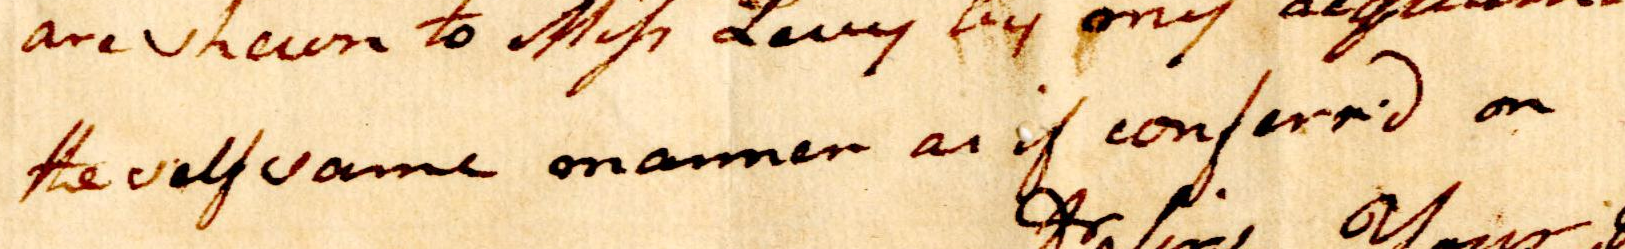the selfsame manner as if conferr'd on
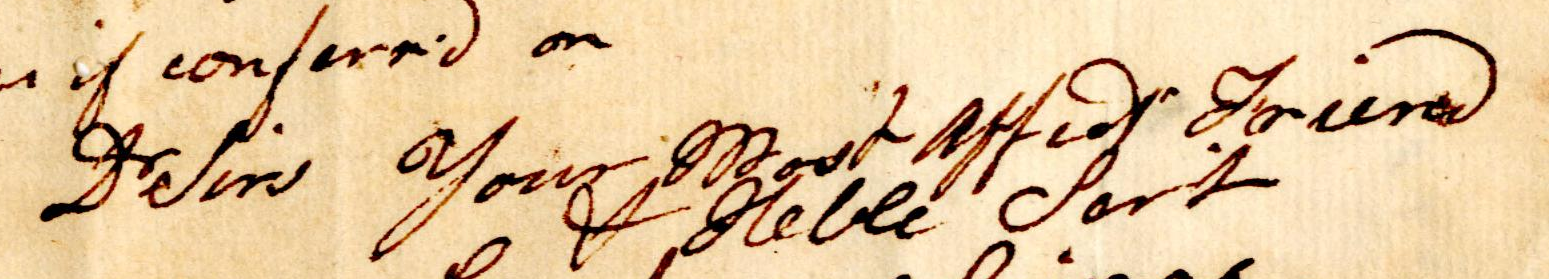D^r Sir Your most Affed^r Friend
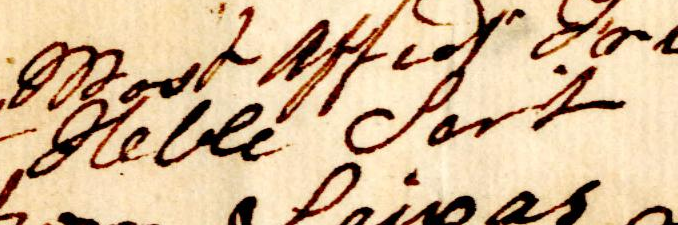& H^ble Ser^t
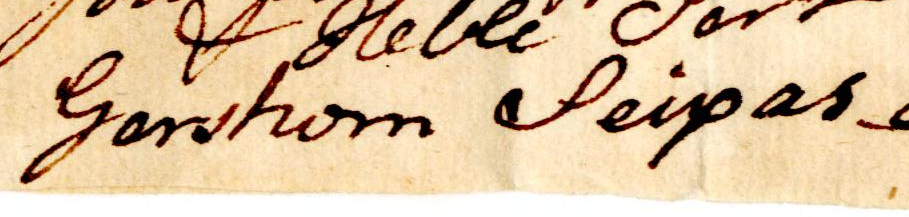Gershom Seixas
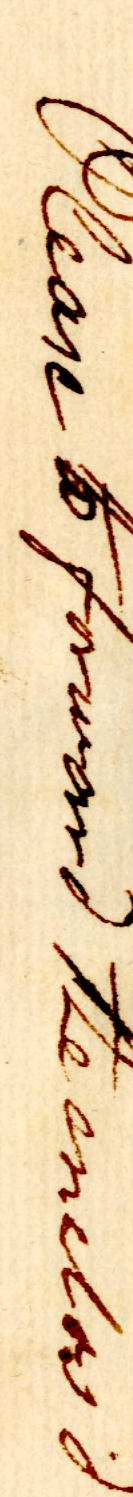Please to forward the enclosd
